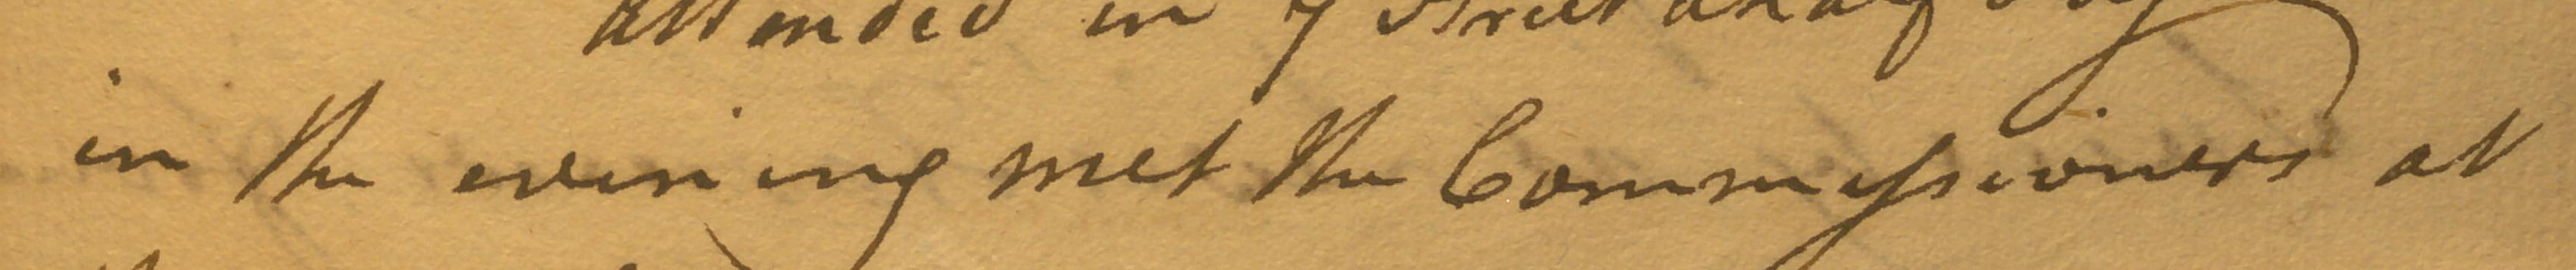in the evening met the Commissioners at
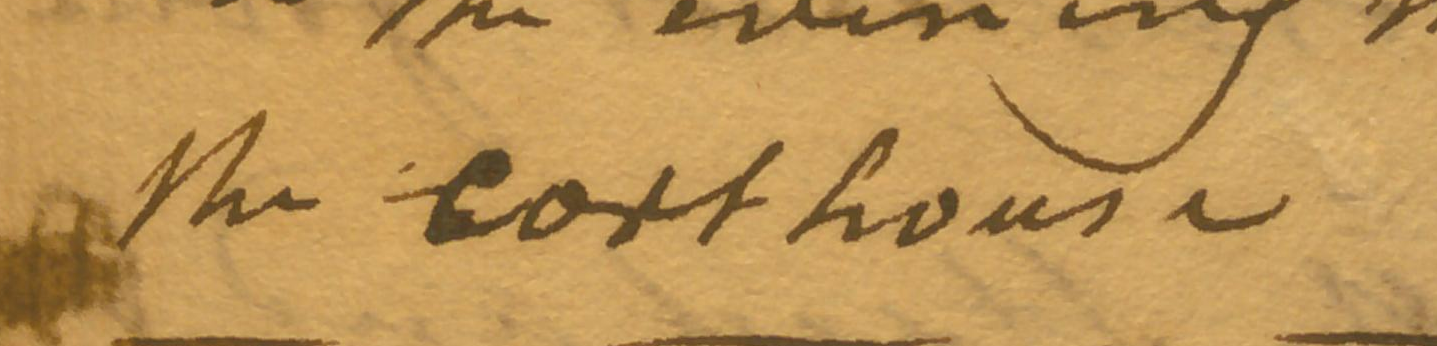the cort house
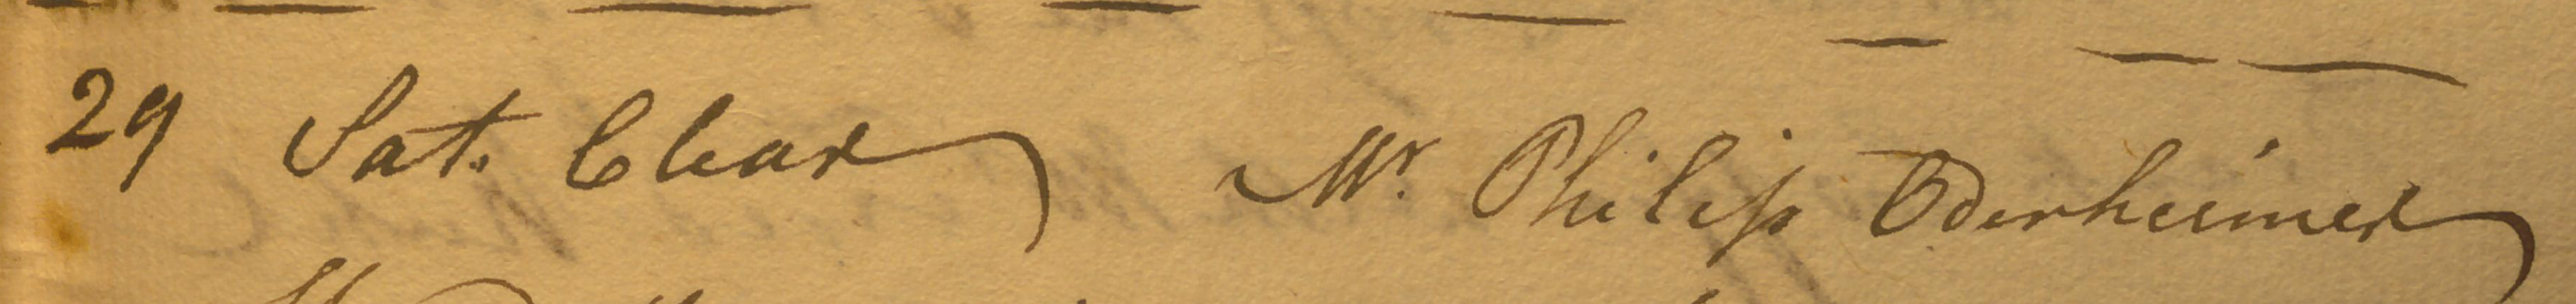29 Sat. Clear M^r. Philip Odenheimer
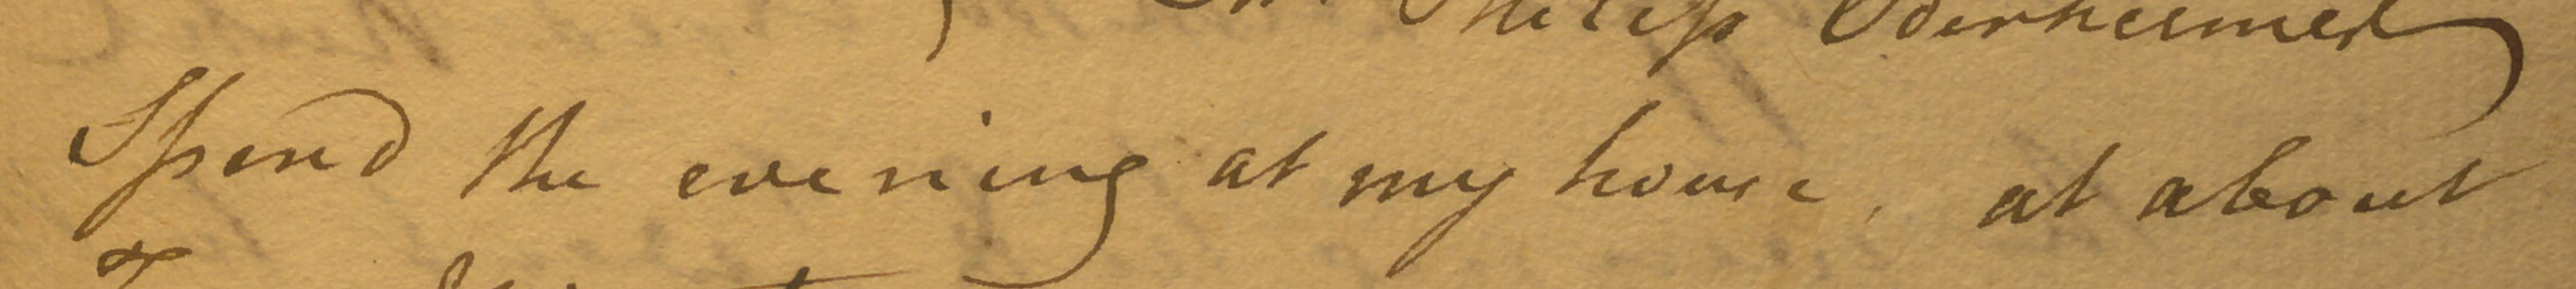spend the evening at my house, at about
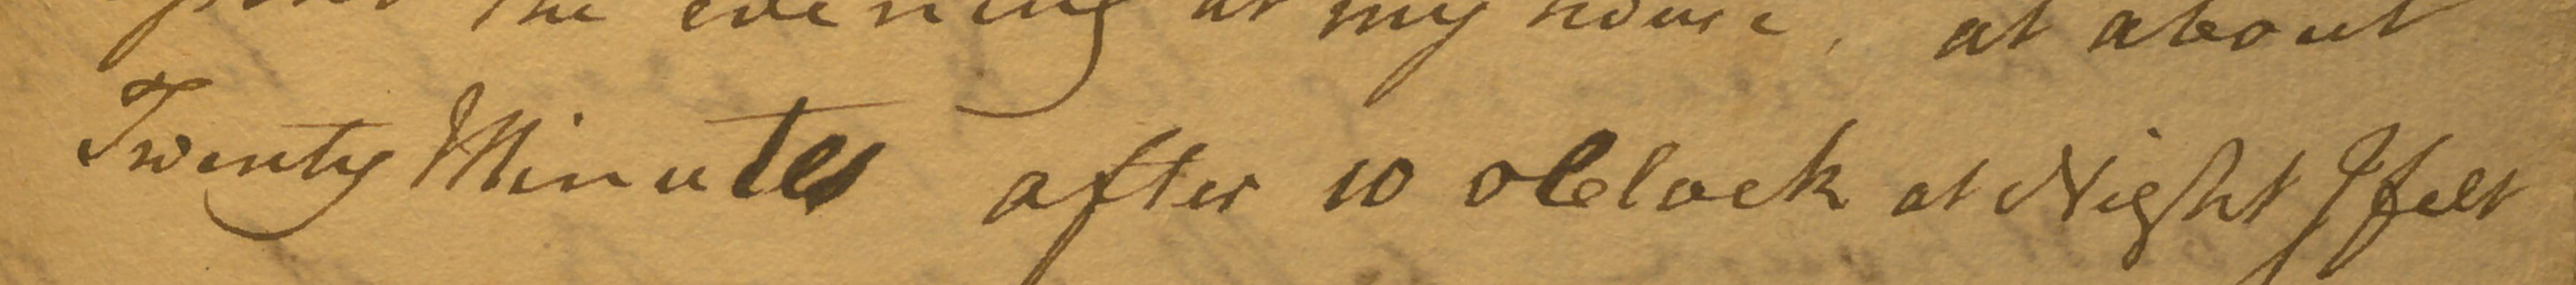Twenty Minutes after 10 oClock at Night I felt
